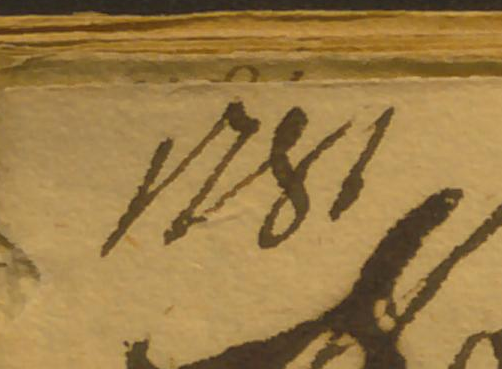1781
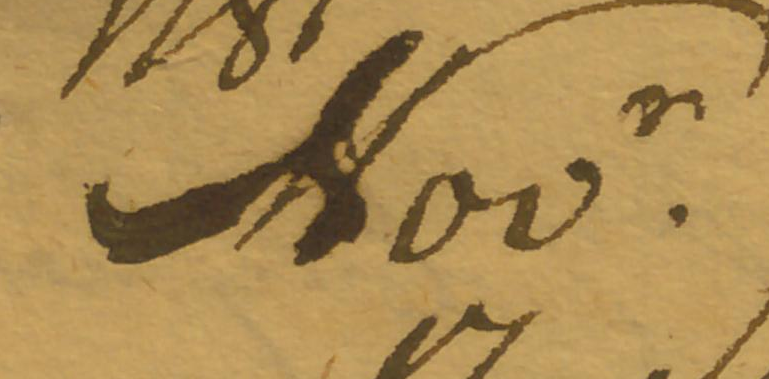Nov^r.
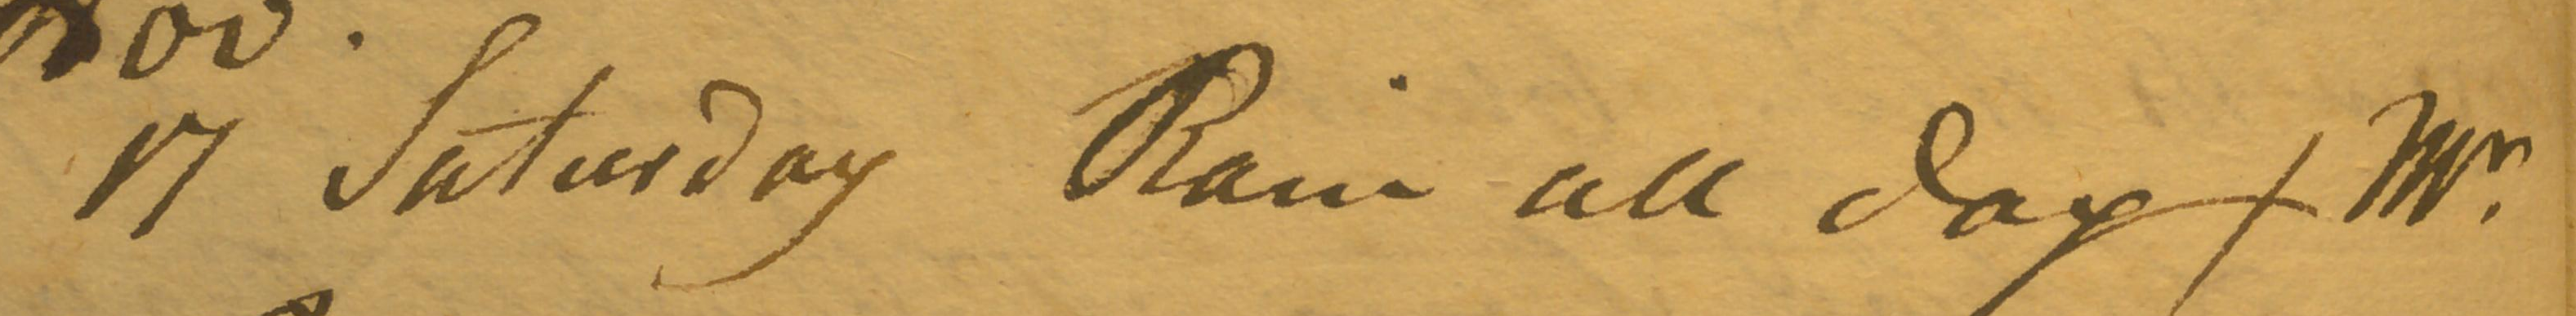17 Saturday Rain all day, M^r.
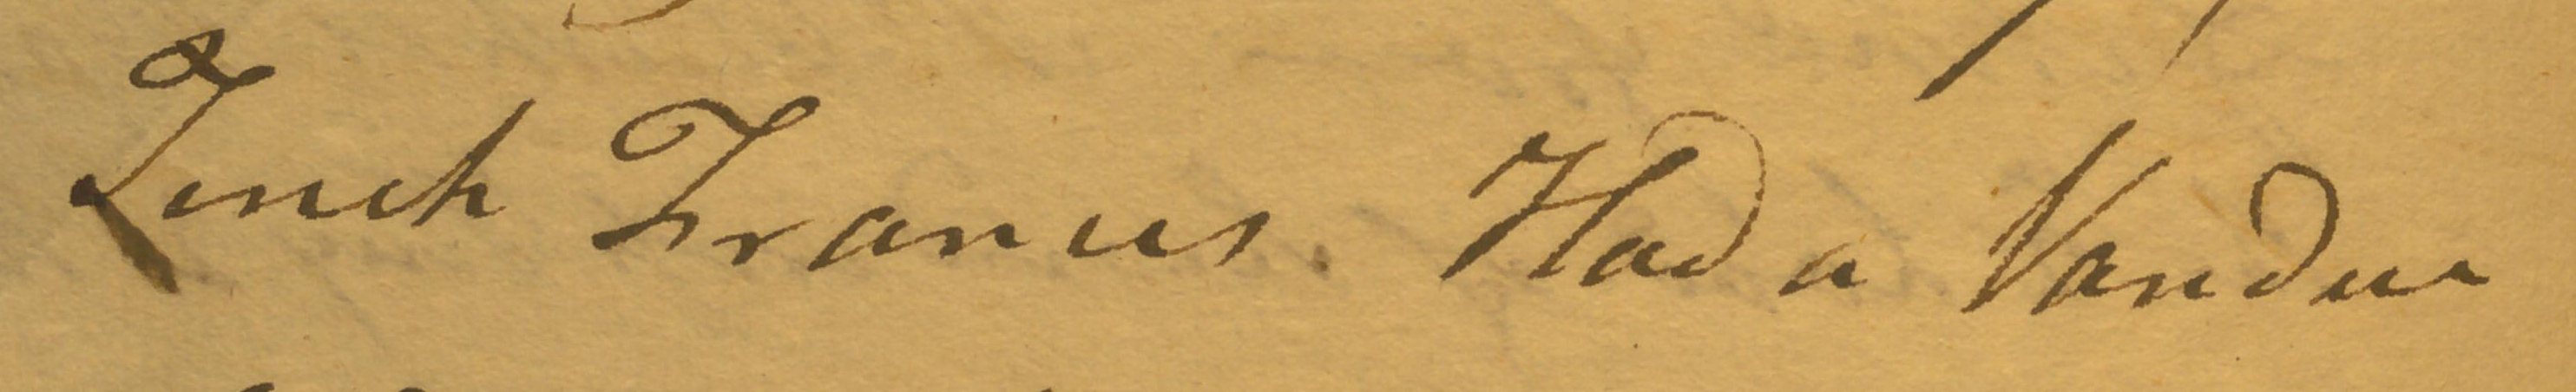Tench Frances Had a Vandue
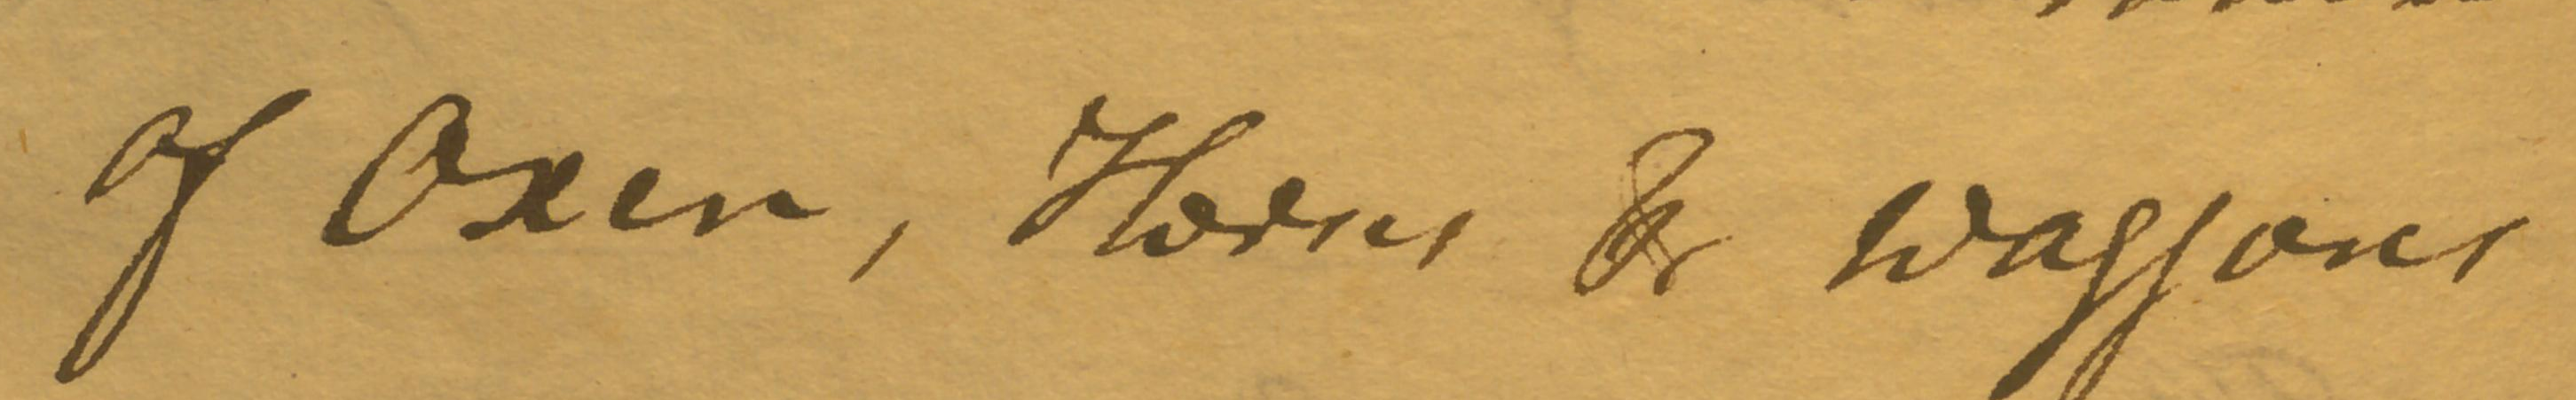of Oxen, Horses & waggons
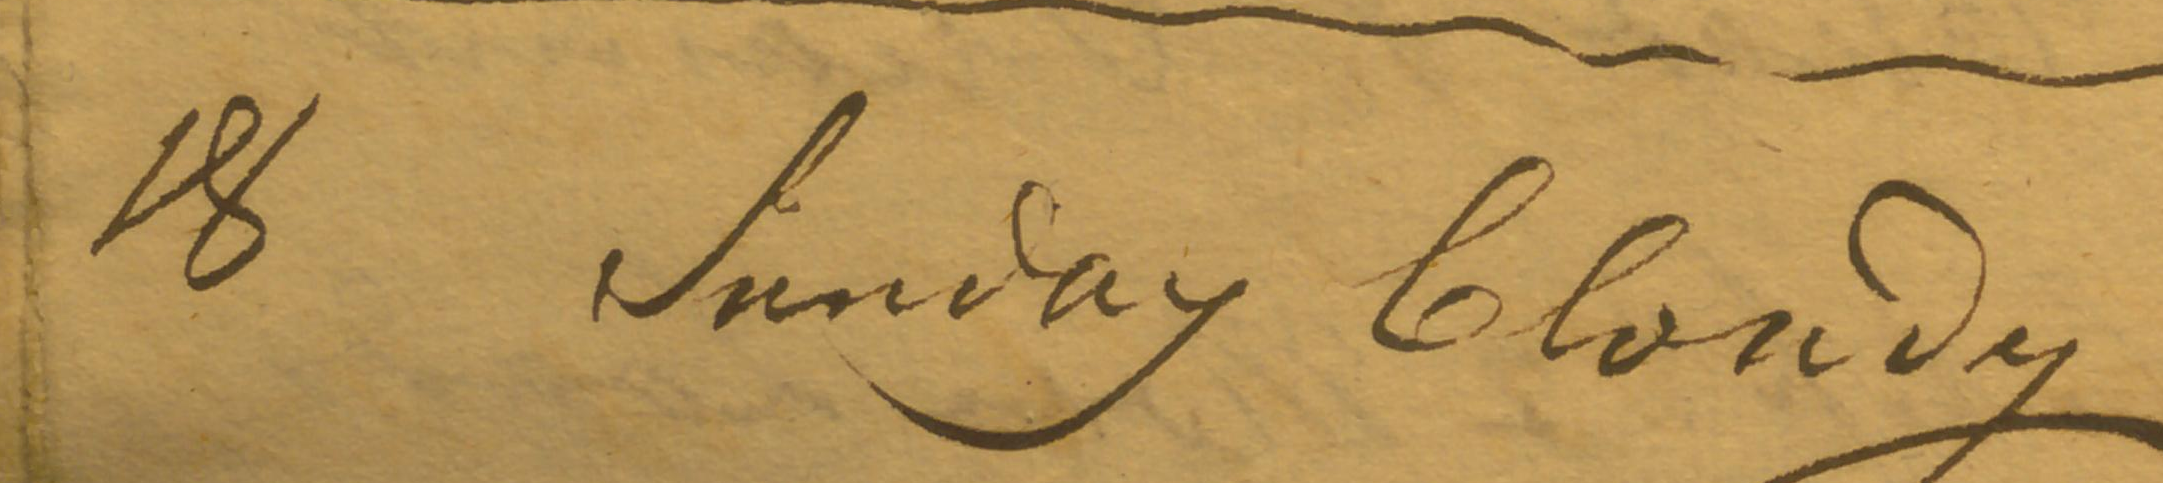18 Sunday Cloudy
